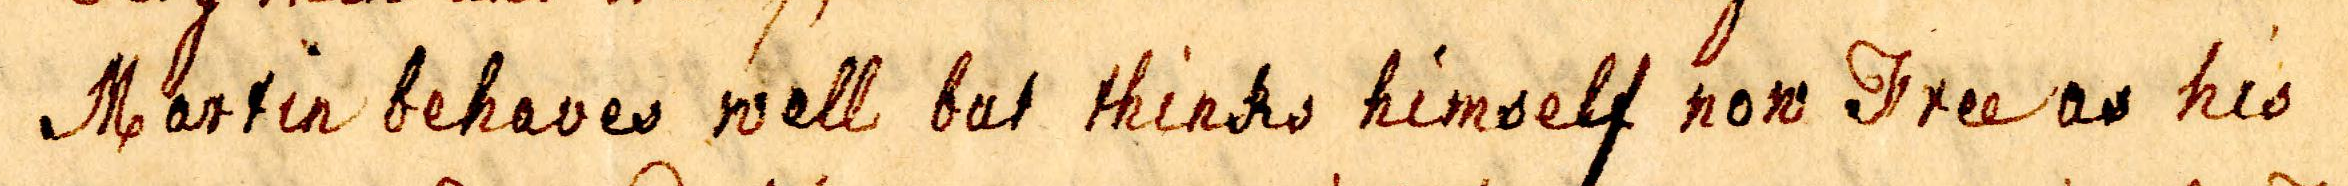Martin behaves well but thinks himself now Free as his
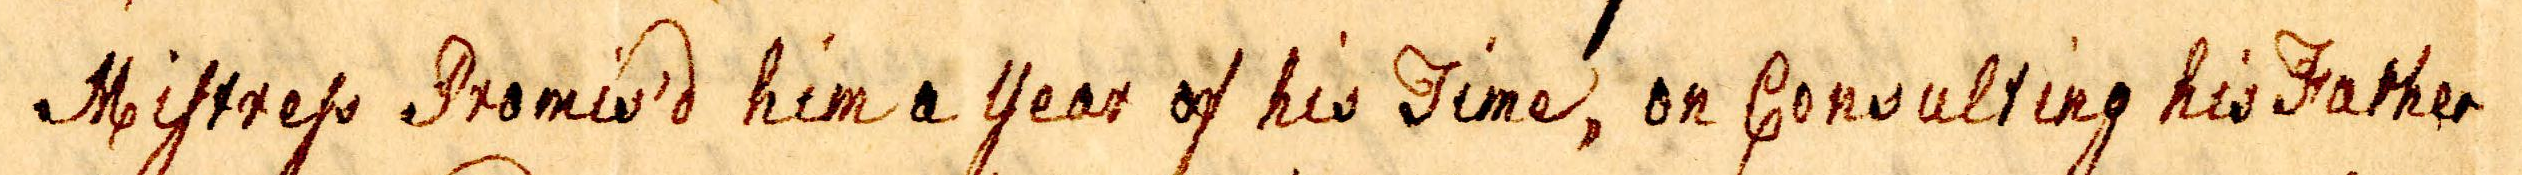Mistress Promis'd him a year of his Time, on Consulting his Father
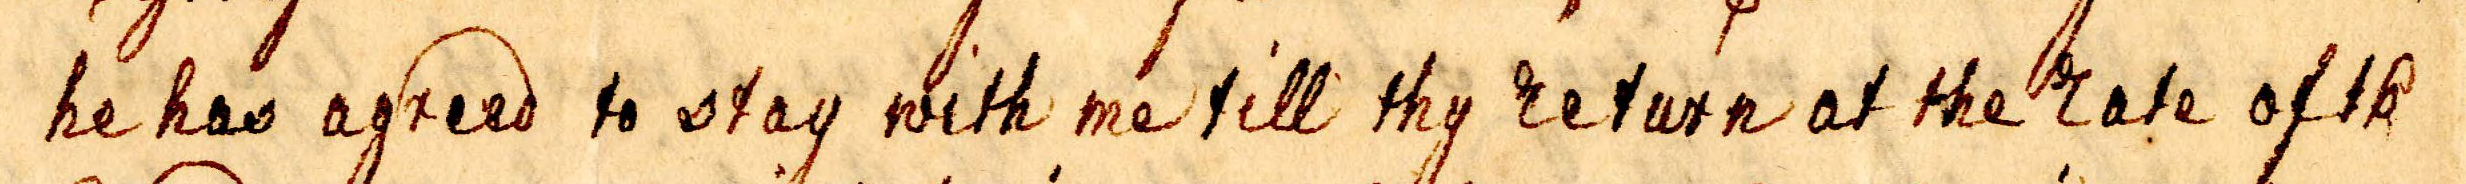he has agreed to stay with me till thy return at the rate of 16
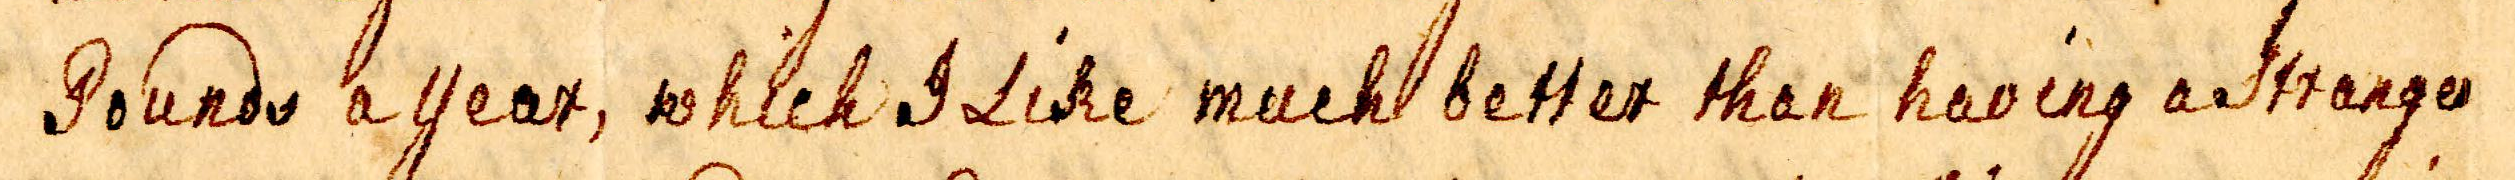Pounds a year, which I Like much better than having a Stranger
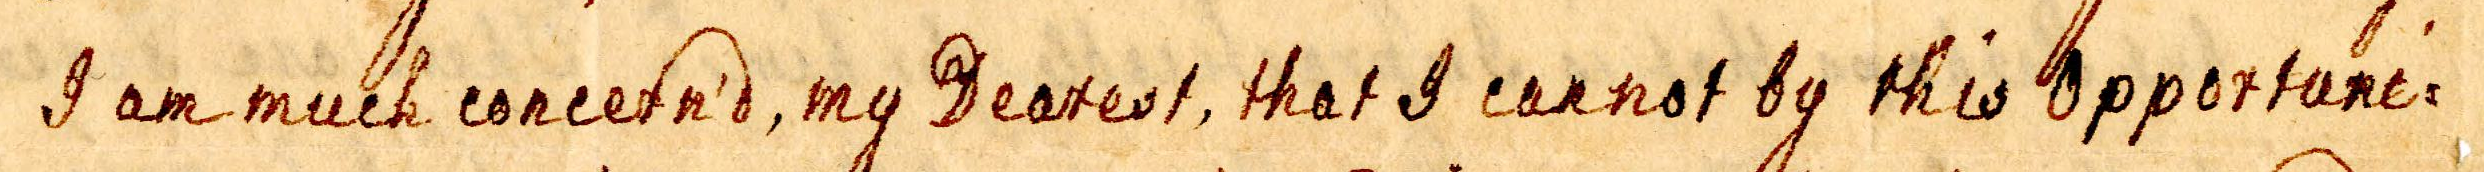I am much concern'd, my Dearest, that I cannot by this Opportuni-
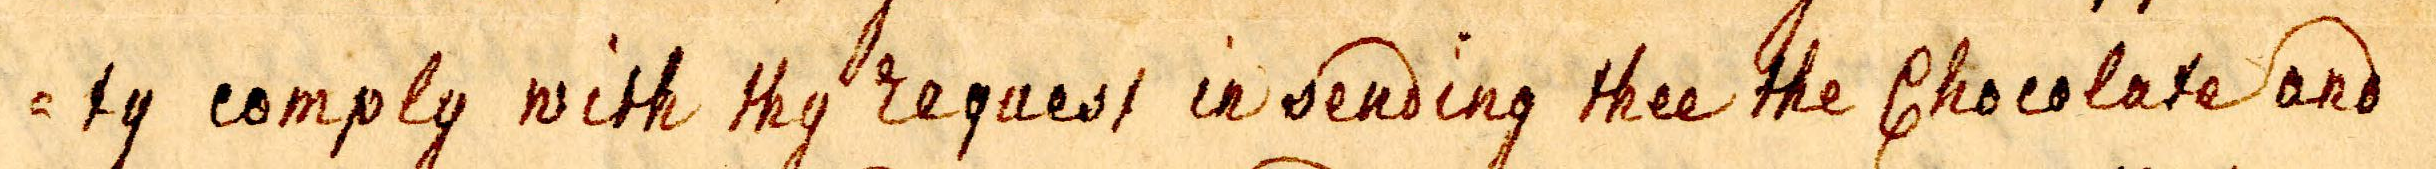-ty comply with thy request in sending thee the Chocolate and
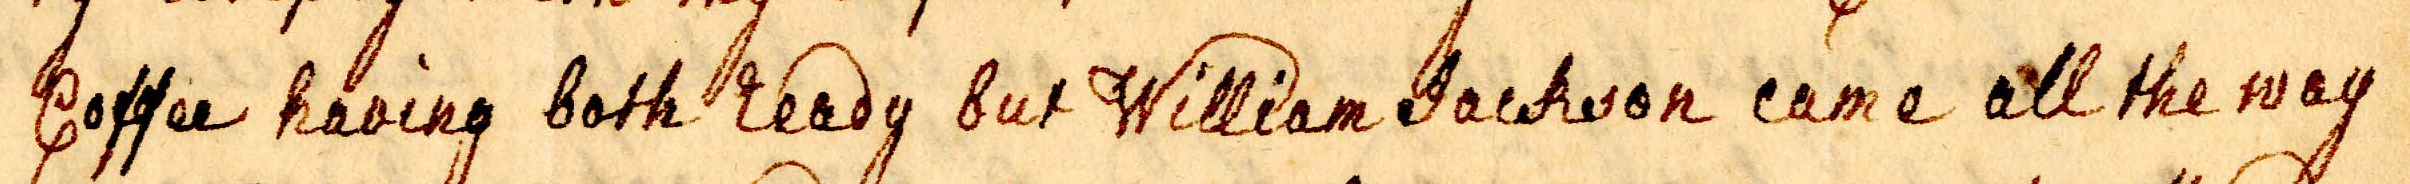Coffee having both ready but William Jackson came all the way
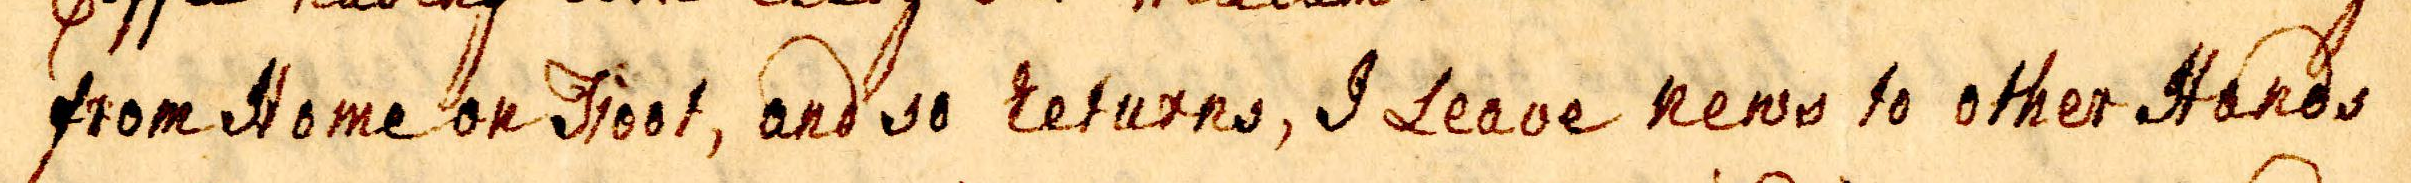from Home on Foot, and so returns, I leave news to other Hands
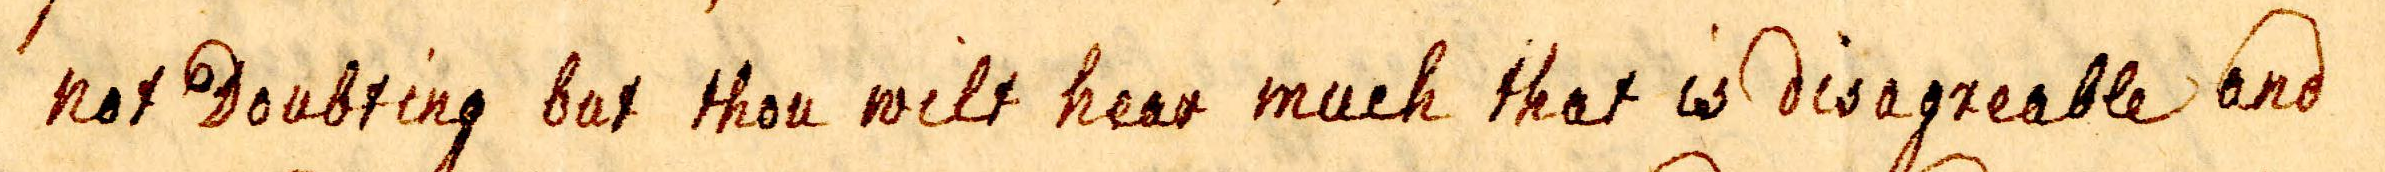not Doubting but thou wilt hear much that is disagreeable and
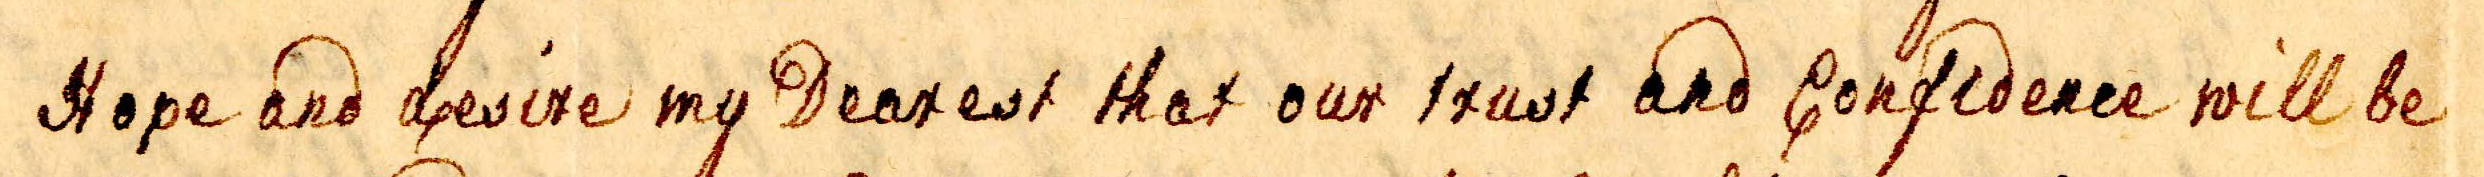Hope and desire my Dearest that our trust and Confidence will be
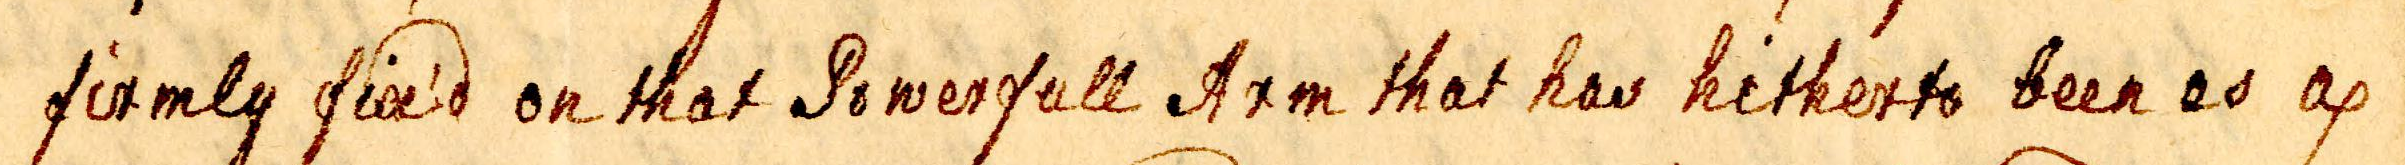firmly fix'd on that Powerfull Arm that has hitherto been as a
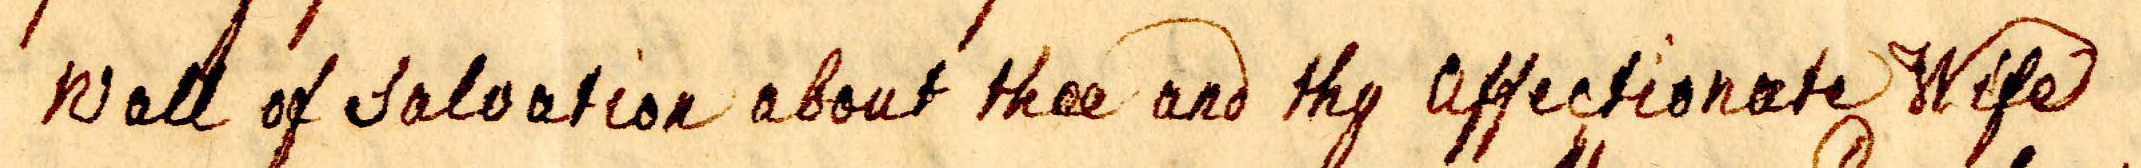Wall of Salvation about thee and thy Affectionate Wife
